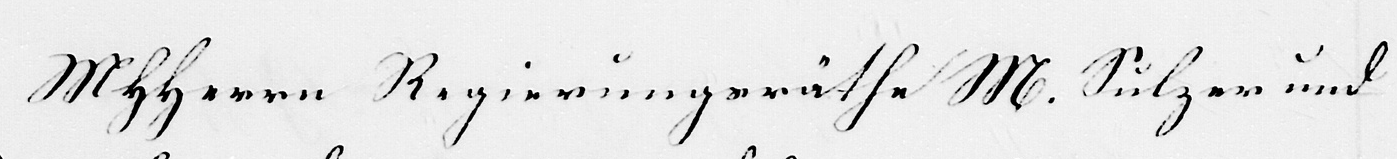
MHHerrn Regierungsräthe M. Sulzer und
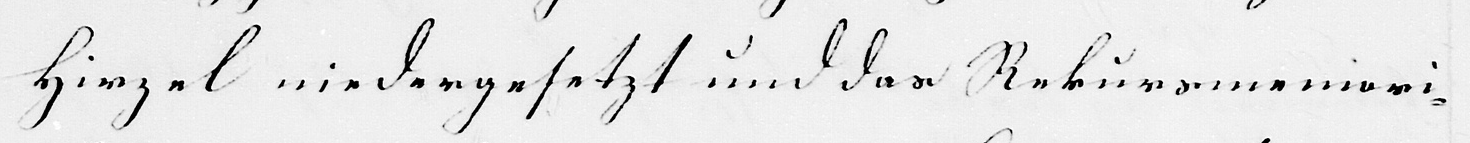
Hirzel niedergesetzt und das Rekursmemori¬
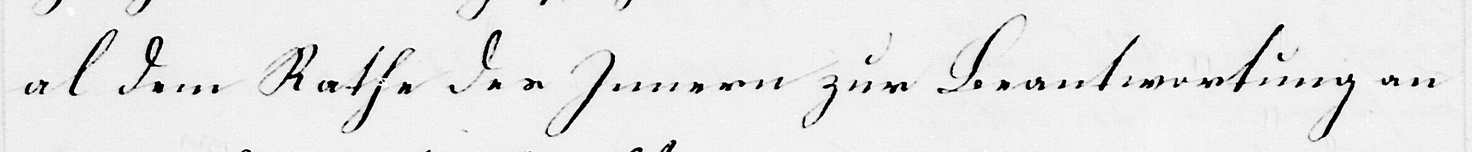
al dem Rathe des Innern zur Beantwortung an
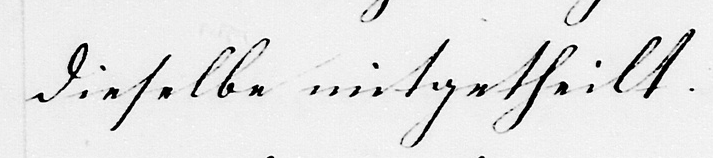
dieselbe mitgetheilt.
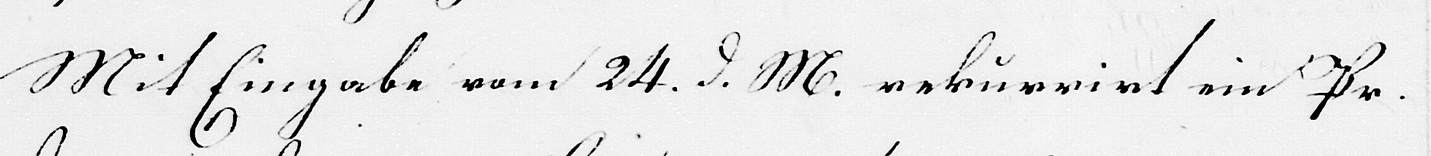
Mit Eingabe vom 24. d. M. rekurrirt ein Pr.
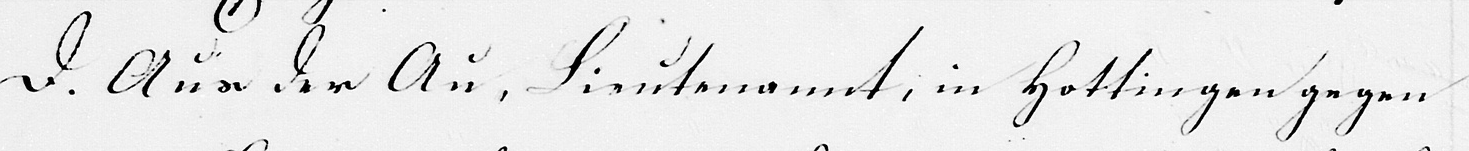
D. Aus der Au, Lieutenannt, in Hottingen gegen
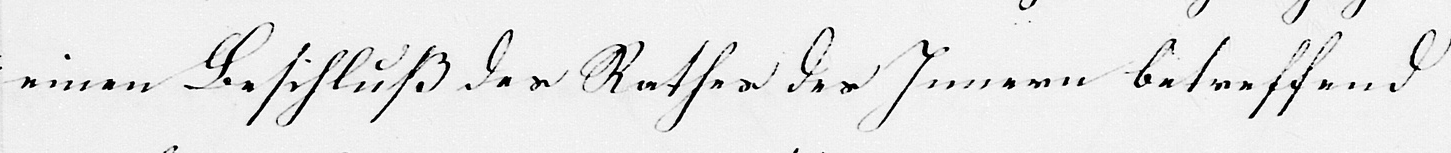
einen Beschluß des Rathes des Innern betreffend
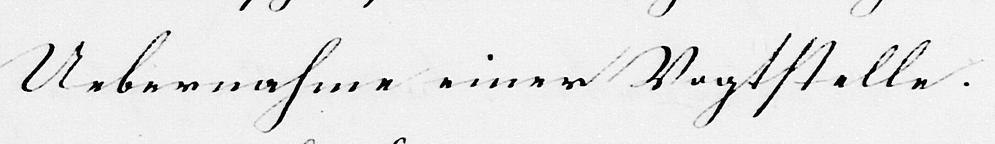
Uebernahme einer Vogtstelle.
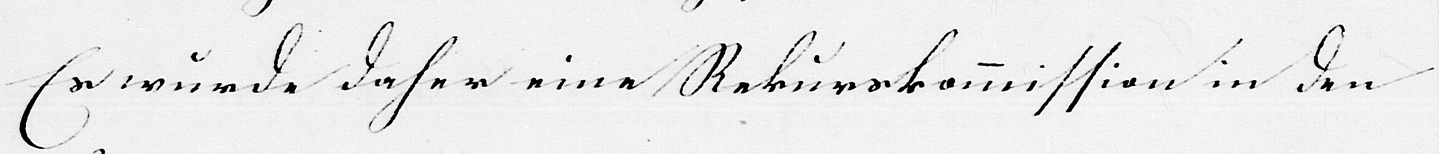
Es wurde daher eine Rekurskommission in den
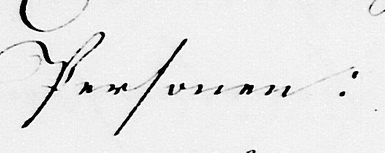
Personen:
